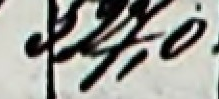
527,0
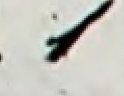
1
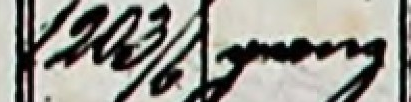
1203/b ganz
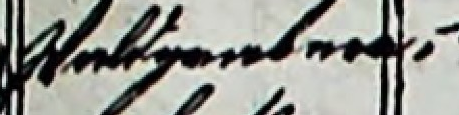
Waldgrabner
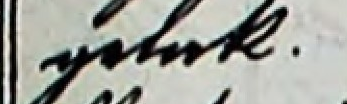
gelak.
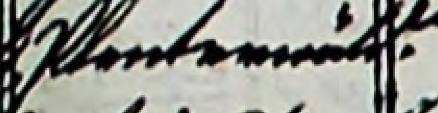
Plenterwäld„
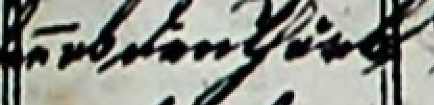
er ?ab den Thur?
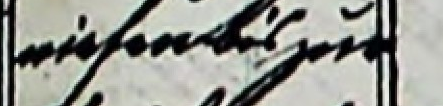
eichen bis zur
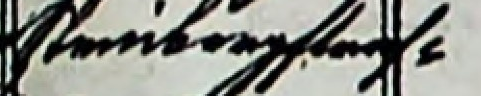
Steinbergstach„
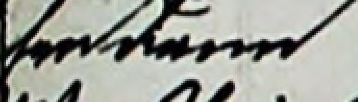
sen dann
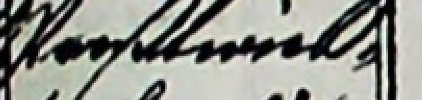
Plenßlwäld„
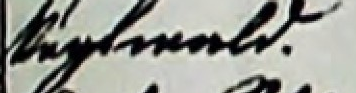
koglwald.
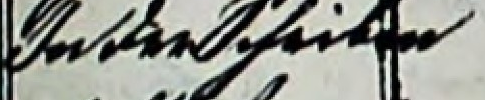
In der Scheiben
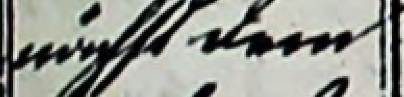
nächst dem
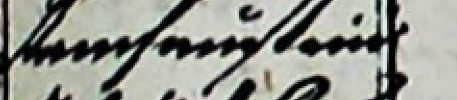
Denhaustein
